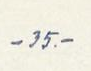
35
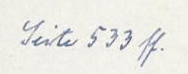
S. 533 ff.
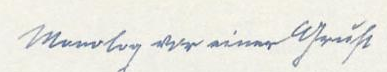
Monolog vor einer Gruft
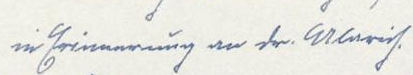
in Erinnerung an Dr. Alarich
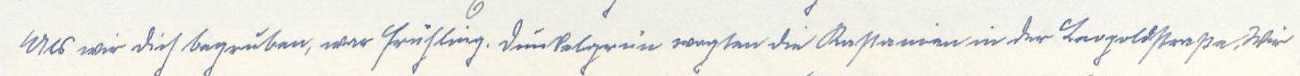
Als wird dich begruben, war Frühling. Dunkelgrün wogten die Kastanien in der Leopoldstraße. Wir
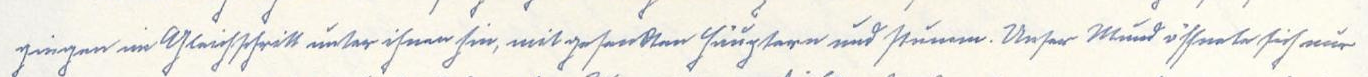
gingen im Gleichschritt unter ihnen hin, mit gestreckten Häuptern und stumm. Unser Mund öffnete sich nur
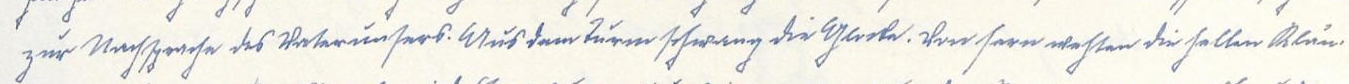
zur Nachsprache des Vaterunsers. Aus dem Turm schwang die Glocke. Von fern wehten die hellen Klän-
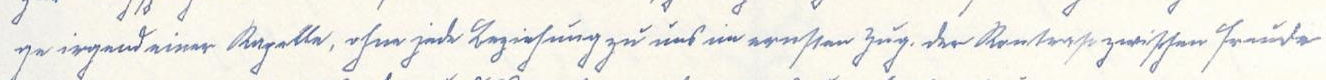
ge irgendeiner Kapelle, ohne jede Beziehung zu uns im ernsten Zug. Der Kontrast zwischen Freude
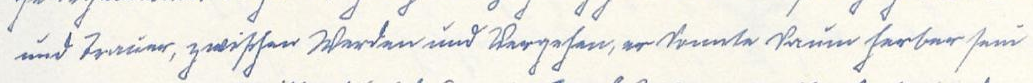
und Trauer, zwischen Werden und Vergehen, er konnte härter sein.
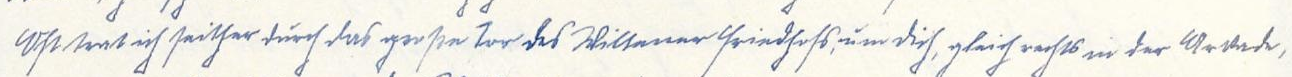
Oft trat ich seither durch das große Tor des Wiltener Friedhofs, um dich, gleich rechts in der Arkade,
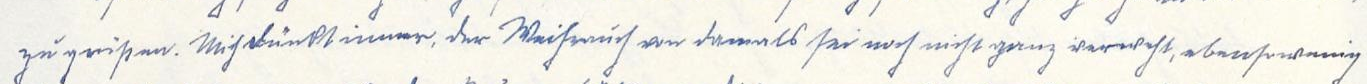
zu grüßen. Mich dünkt immer, der Weihrauch von damals sei noch nicht ganz verweht, ebensowenig
